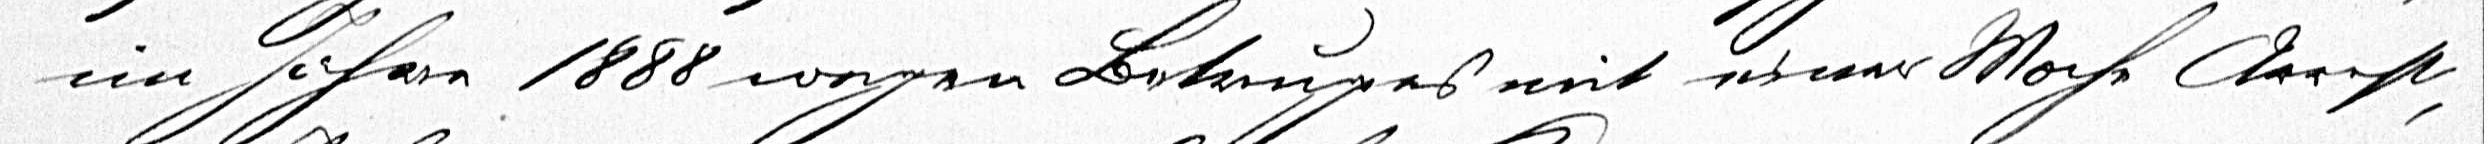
im Jahre 1888 wegen Betruges mit einer Woche Arrest,
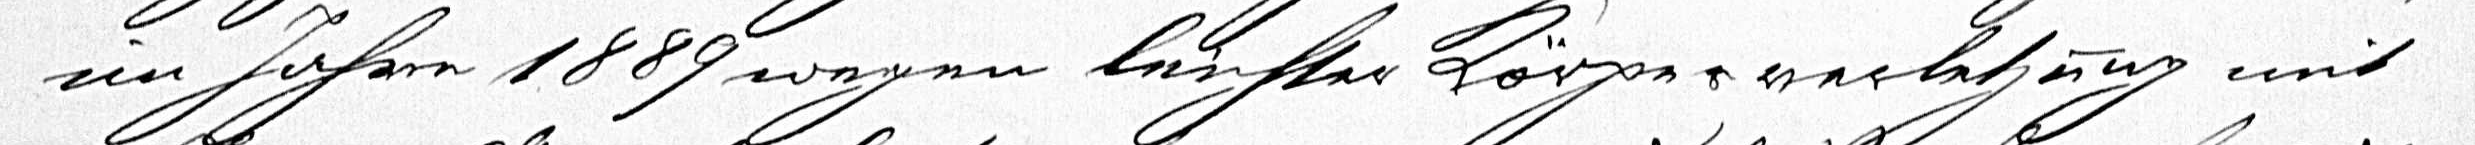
ein Jahre 1889 wegen leichter Körperverletzung mit
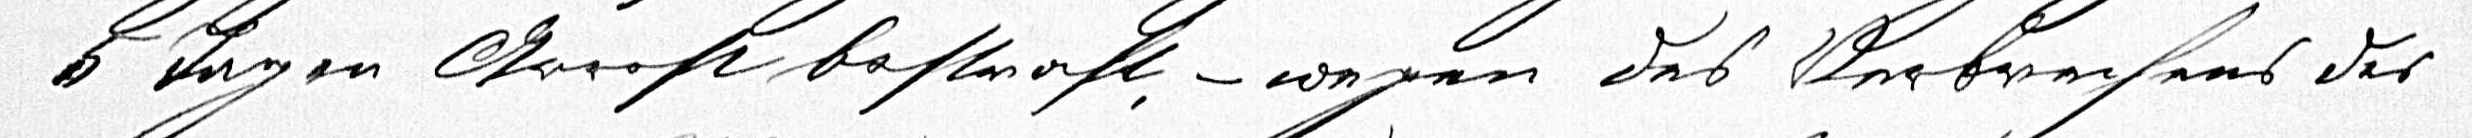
5 Tagen Arrest bestraft, -- wegen des Verbrechens des
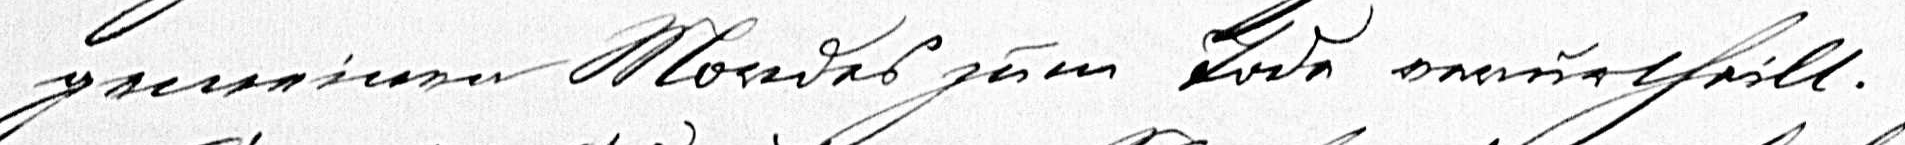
gemeinen Mordes zum Tode verurtheilt.
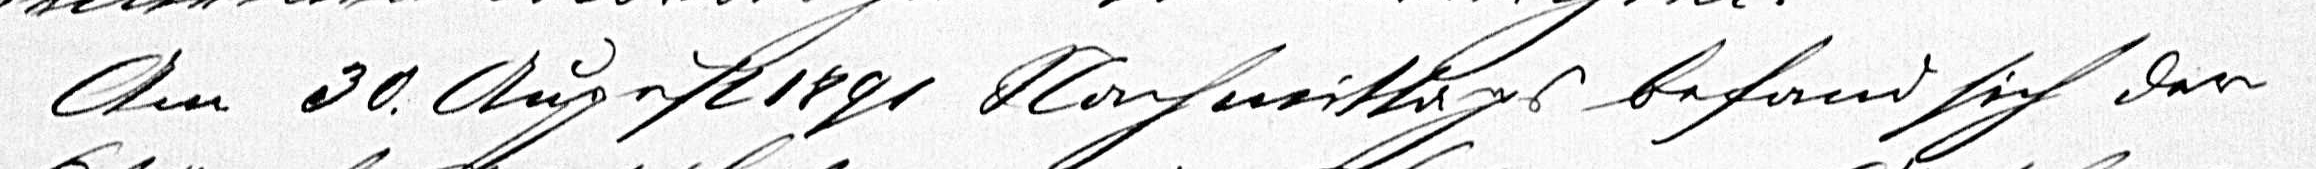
Am 30. August 1891 Nachmittags befand sich der
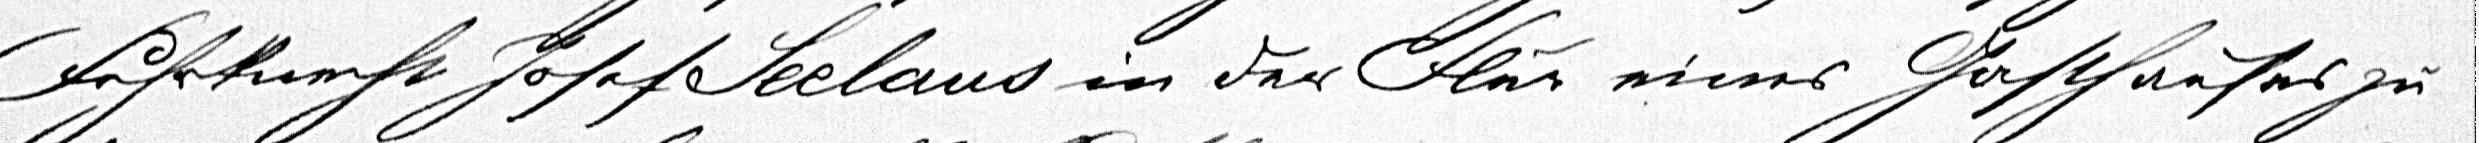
Fuhrknecht Josef Seelaus in der Flur eines Gasthauses zu
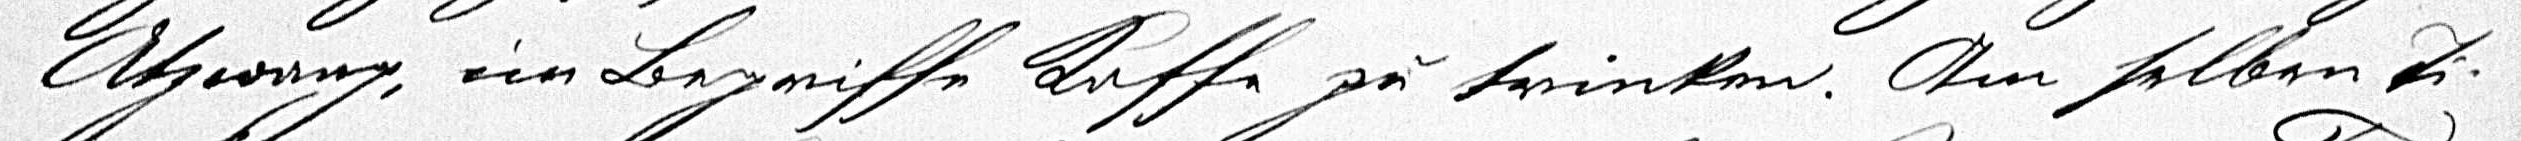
Atzwang, im Begriffe Kaffe zu trinken. Am selben Ti¬
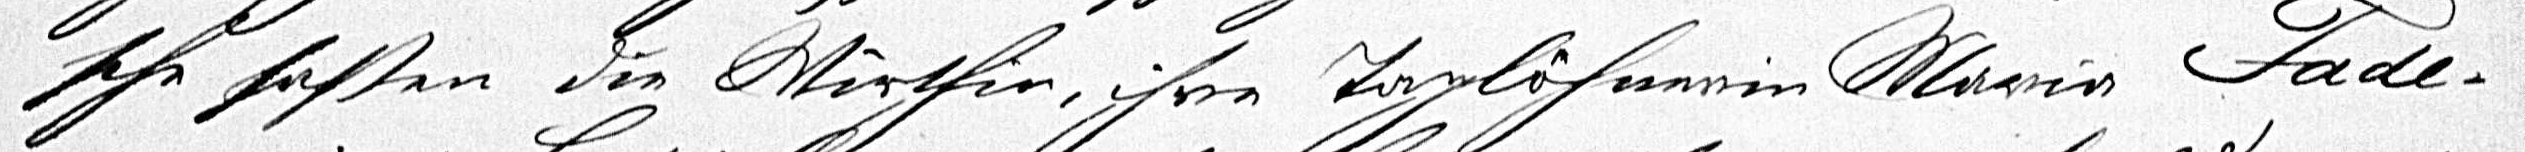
sche saßen die Wirthin, ihre Taglöhnerin Maria Fade¬
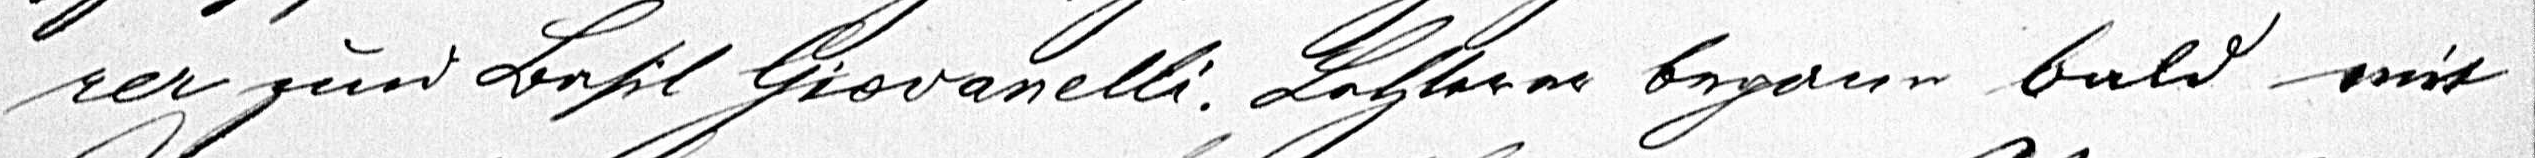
rer und Basil Giovanelli. Letzterer begann bald mit
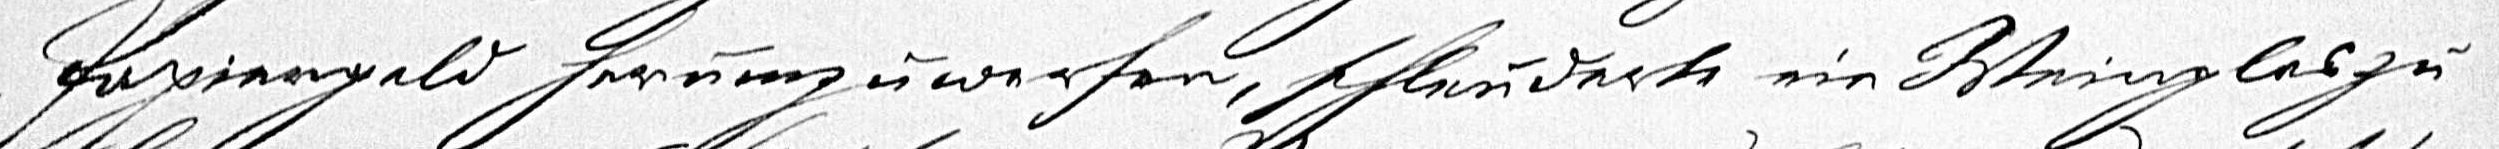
Papiergeld herumzuwerfen, schleuderte ein Weinglas zu
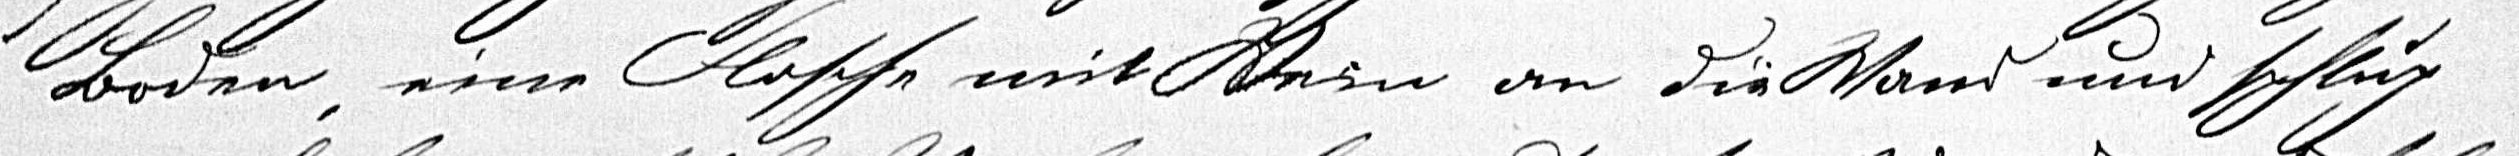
Boden, eine Flasche mit Wein an die Wand und schlug
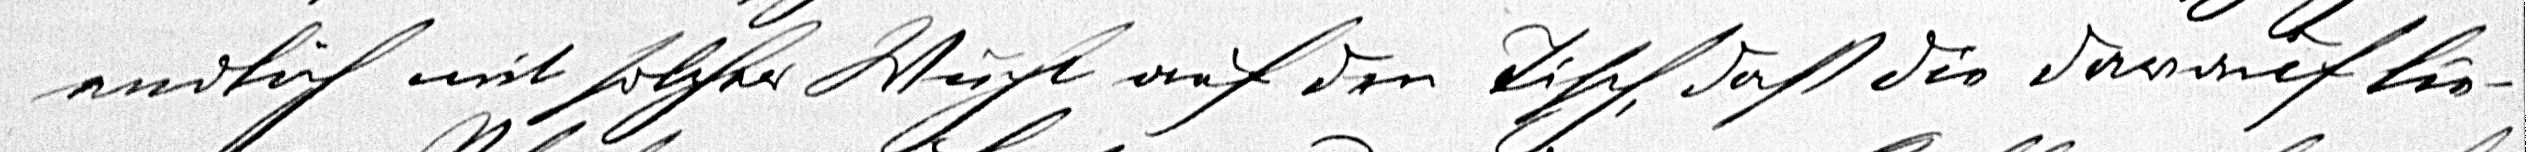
endlich mit solcher Wucht auf den Tisch, daß die darauf lie¬
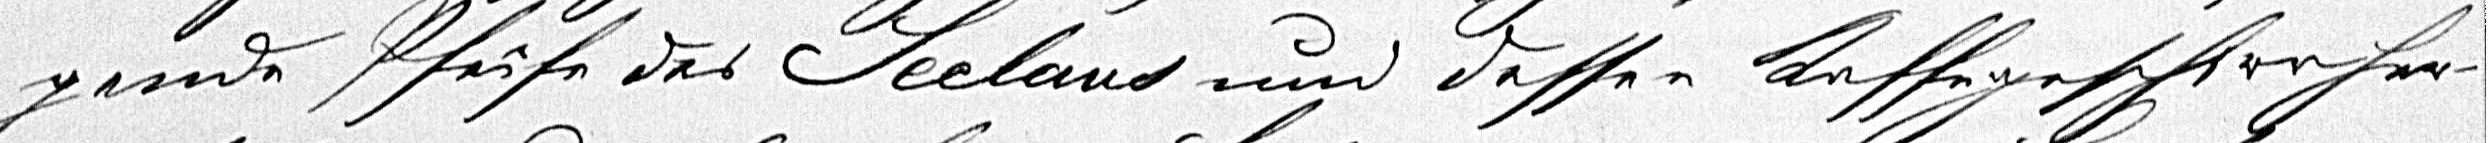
gende Pfeife des Seelaus und dessen Kaffegeschirr her¬
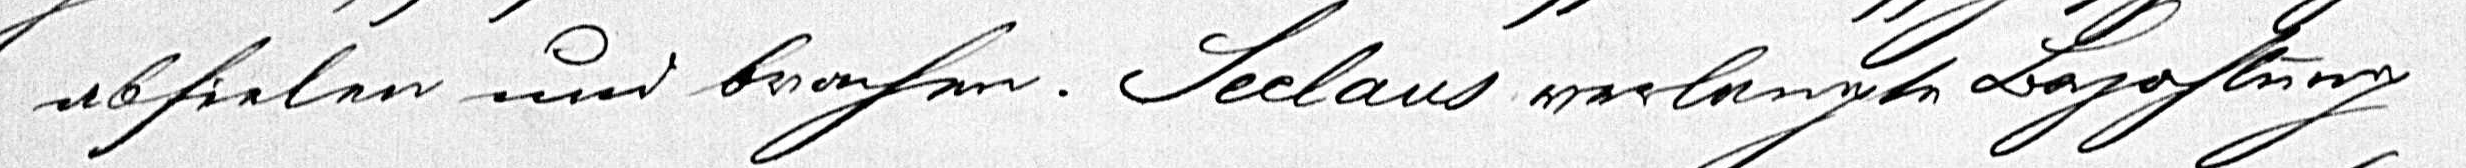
abfielen und brachen. Seelaus verlangte Bezahlung
